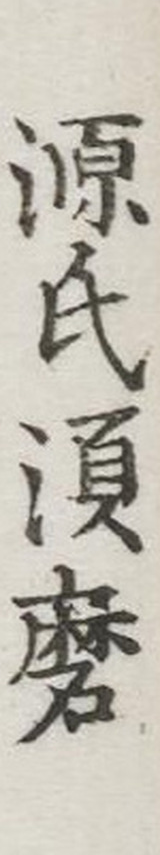源氏須磨
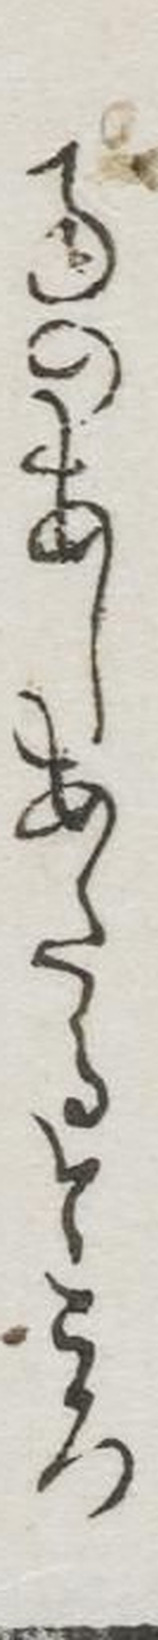雨のあしあたるところ
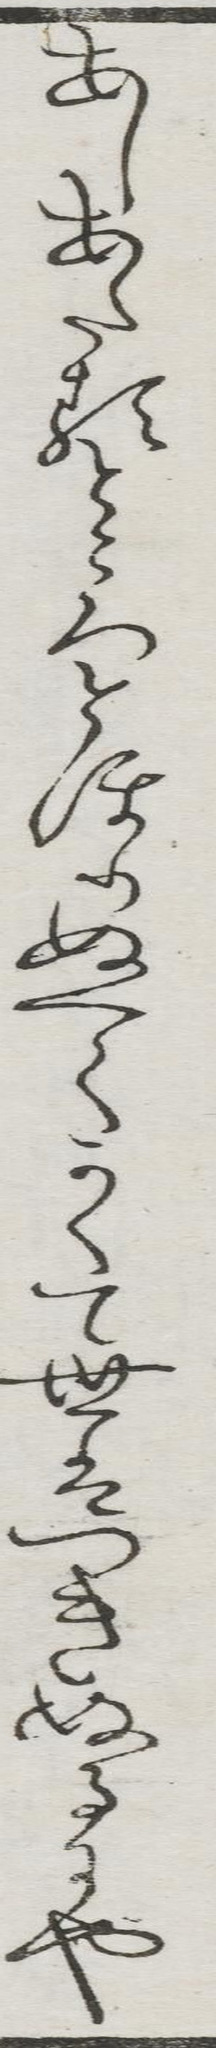あしあたるところとほりぬへくかくて世はつきぬるにや
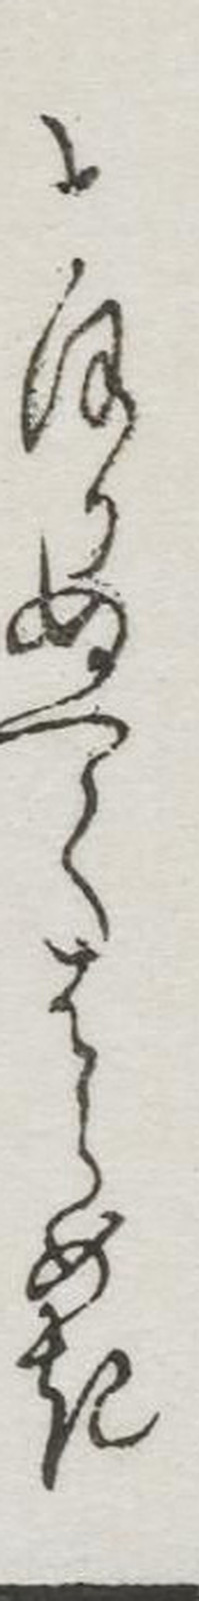とほりぬへくはらめき
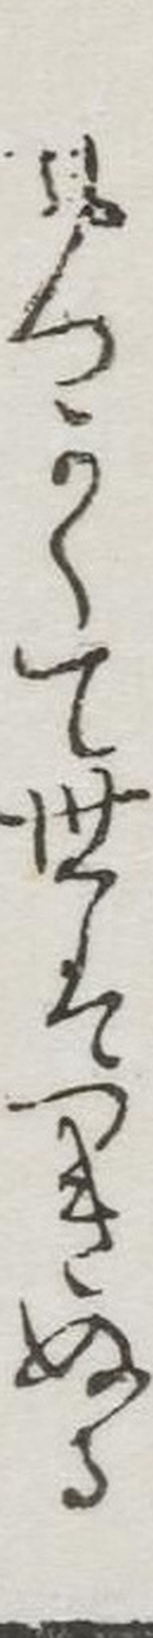おつかくて世はつきぬる
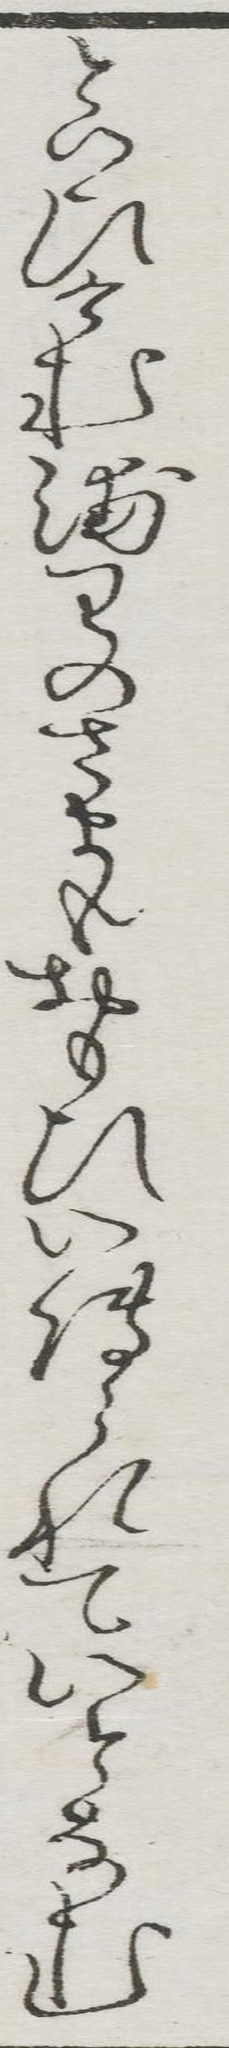といひけむ浦わのさまもおもひいてられていとなむ
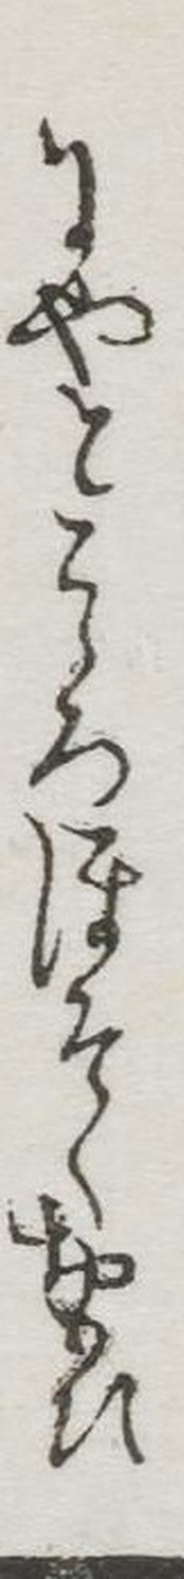にやとこゝろほそくおもひ
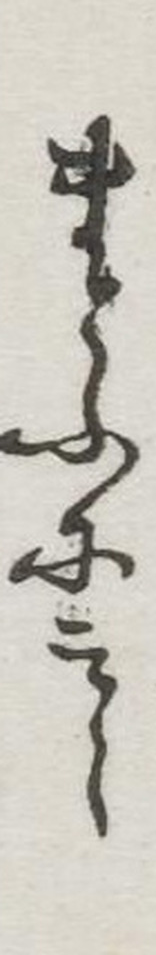まとふに云々
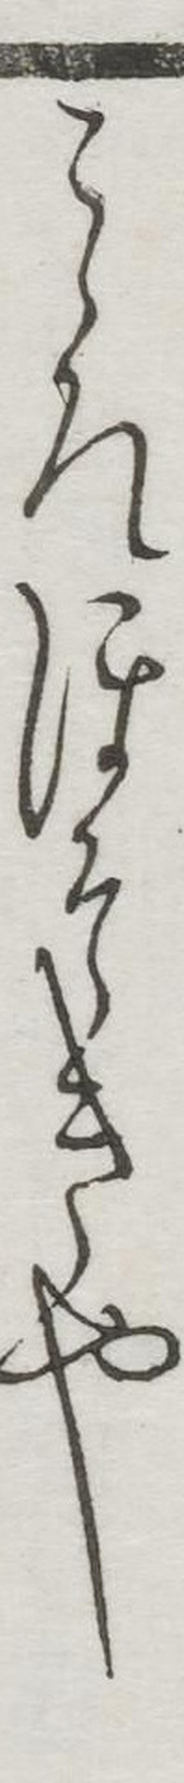こゝろほそきや
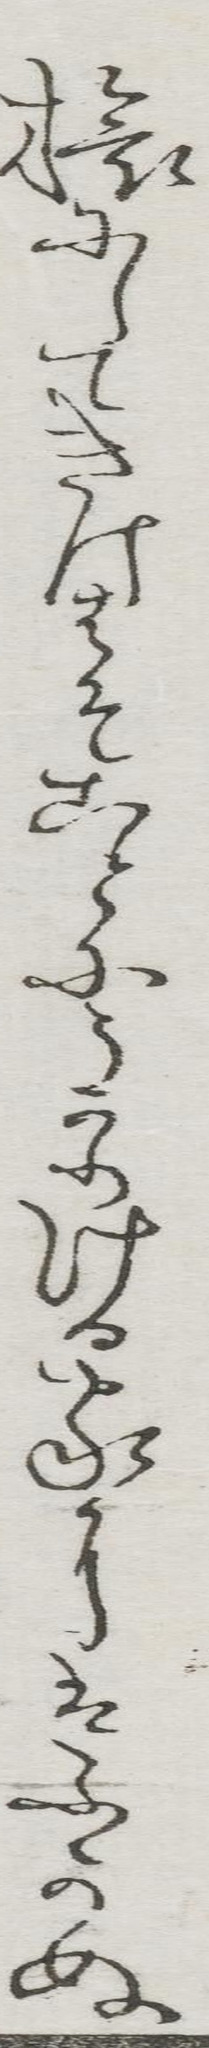旅にしてきけはそことにうかりける家にはふかぬ
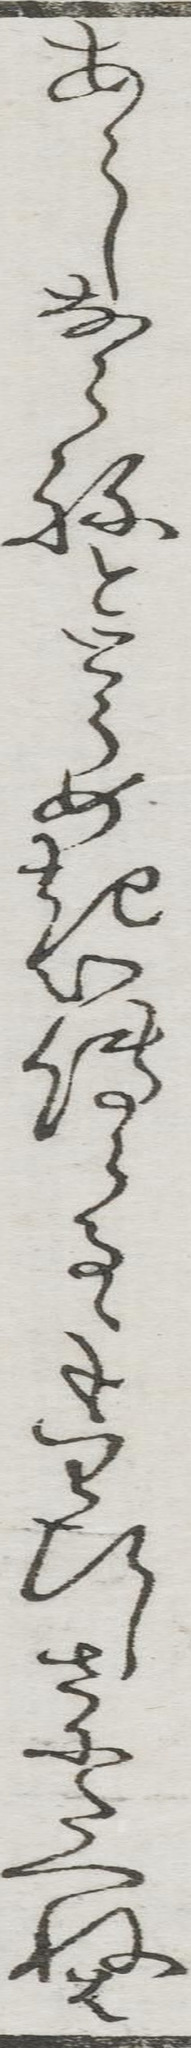あらしならねととうめきいてらるゝもわひしさにたへねは
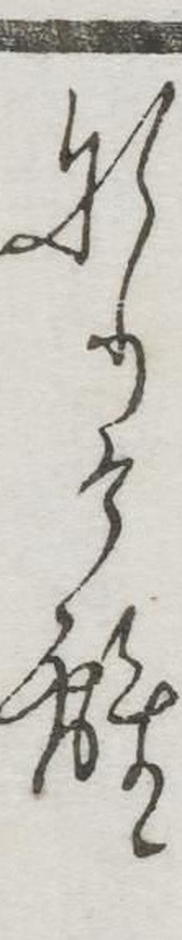なりけり
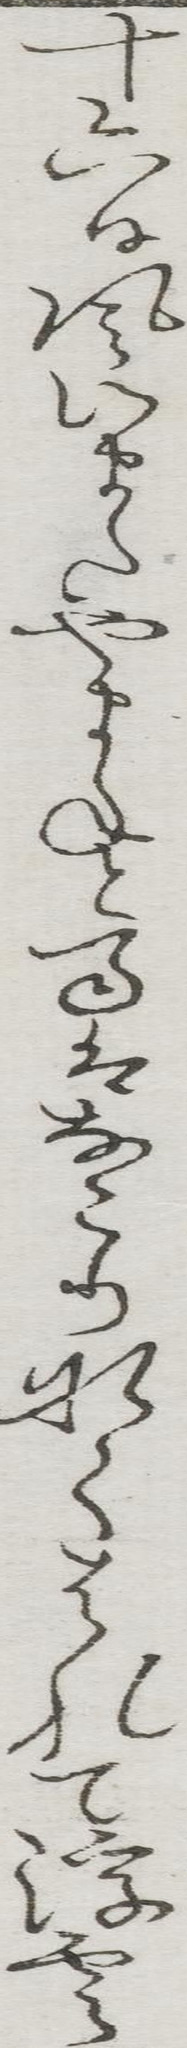十六日風いまたやまねと雨はなこりなくはれて浮雲
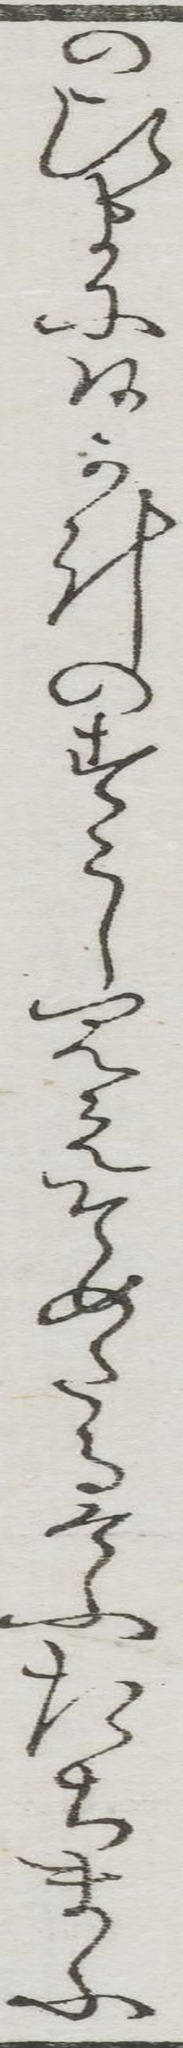のひまに日かけのすこし見えそめたるけふたちまふ
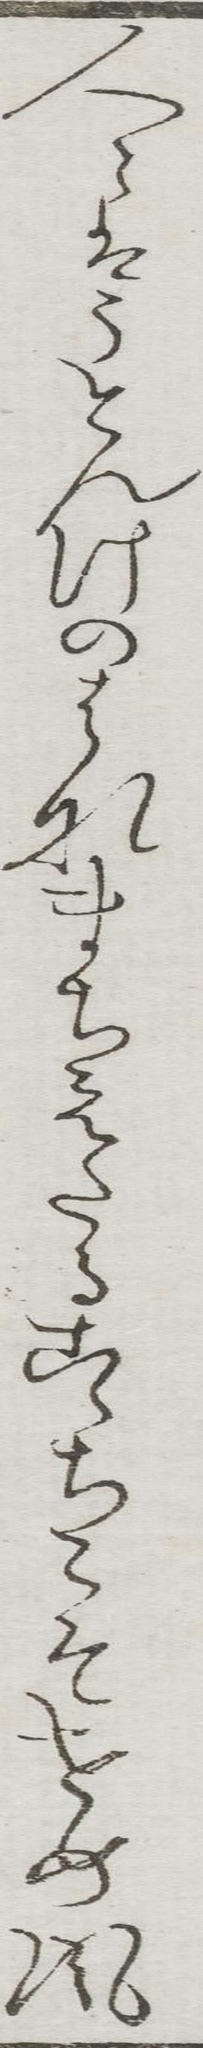人々はうとんけのはなまちえたるこゝちこそせめ風
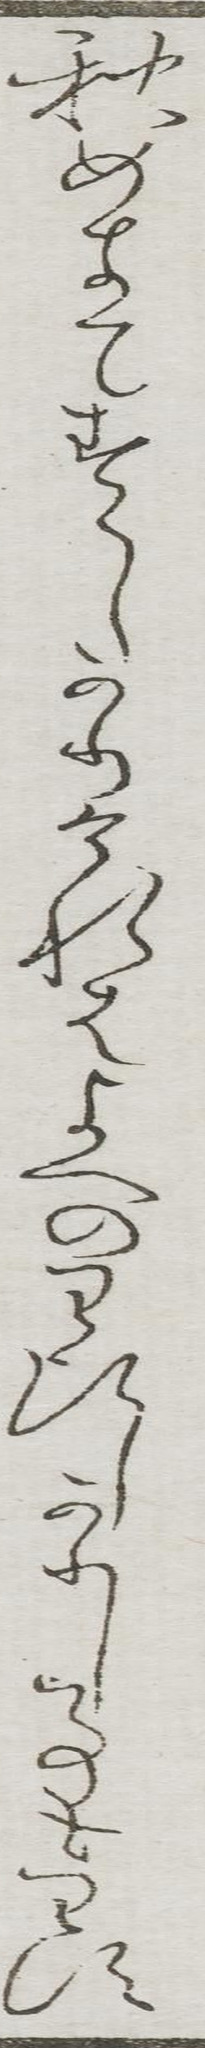秋めきてすゝしかりけれはよへのわひしかりし事もわす
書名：挿画熱海日記　全
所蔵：東京大学地震研究所図書室 Earthquake Research Institute Library, The University of Tokyo, JAPAN
